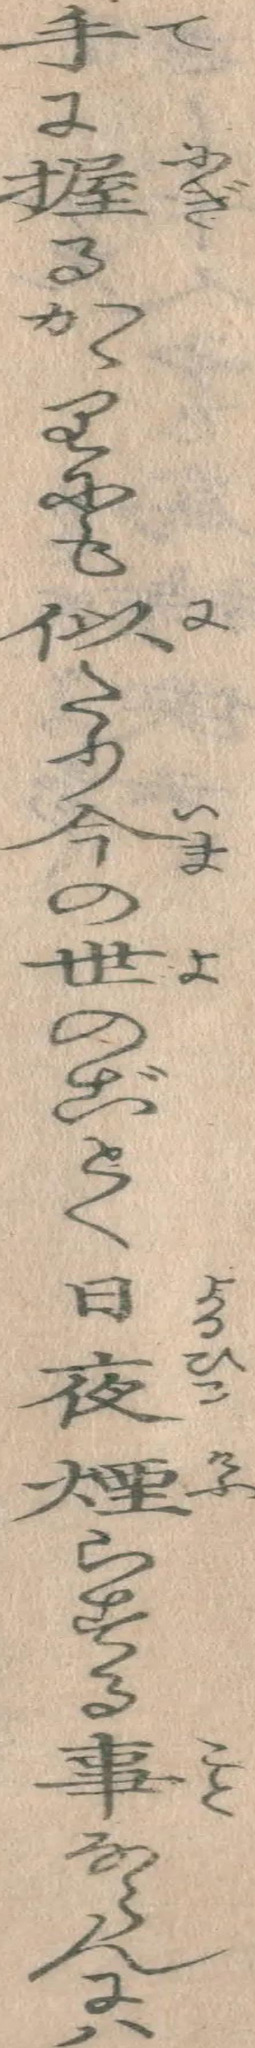手に握るかゝりにも似たり今の世のごとく日夜煙らする事ならんには
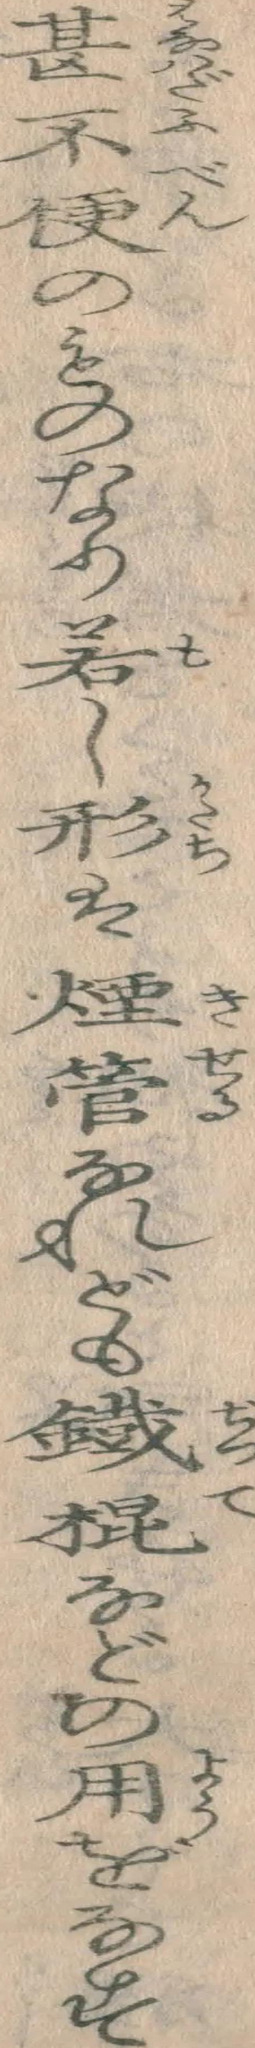甚不便のもなり若し形は煙管なれども鉄棍などの用をなす
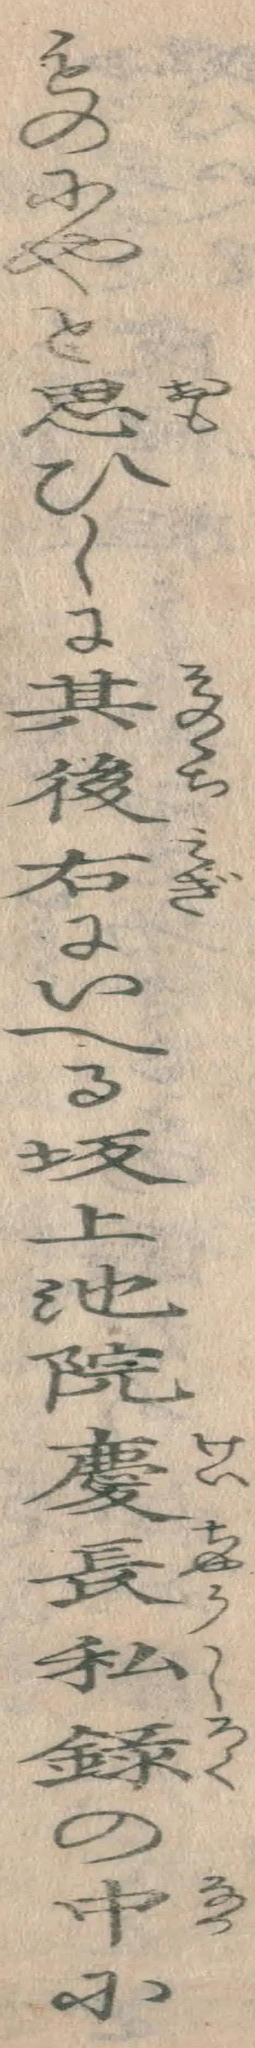ものにやと思ひしに其後右にいへる坂上池院慶長私録の中に
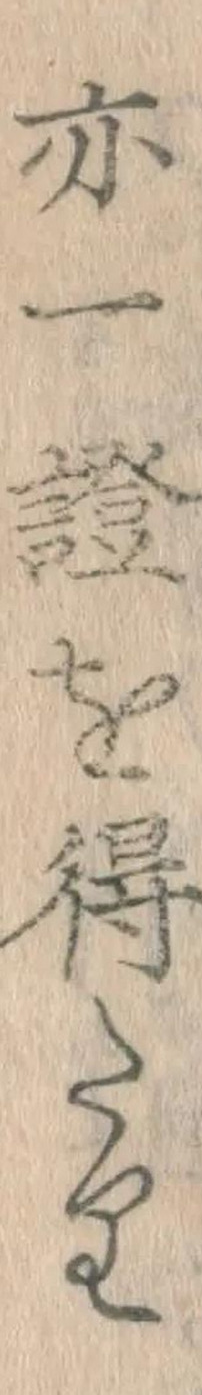亦一証を得たり

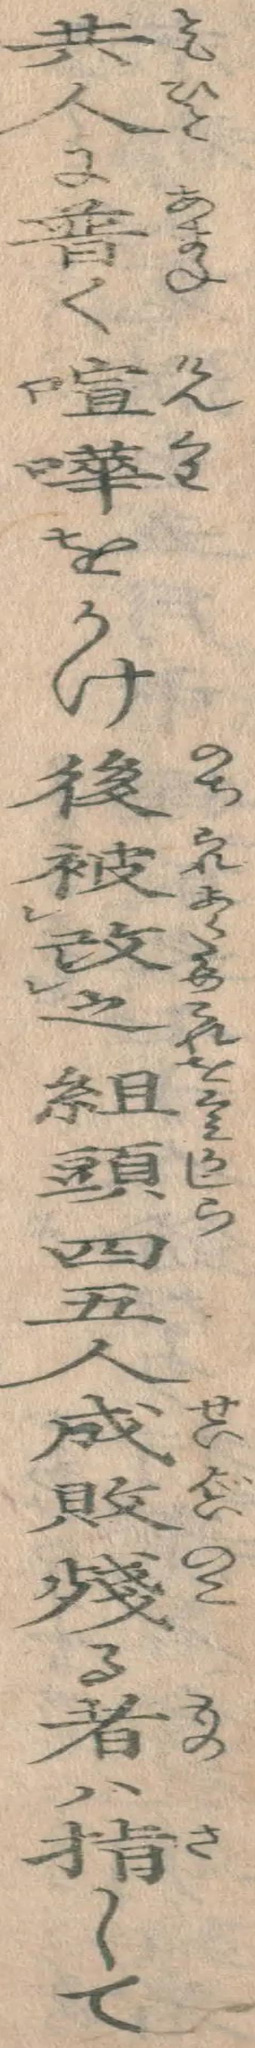共人に普く喧嘩をかけ後被改之組頭四五人成敗残る者は指して
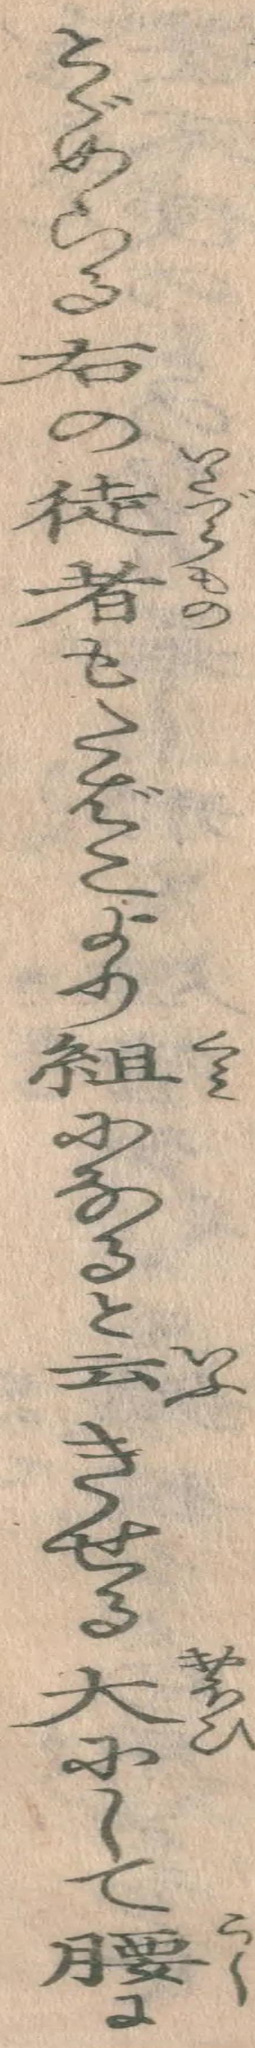とゞめらる右の徒者もたばこより組になると云きせる大にして腰に
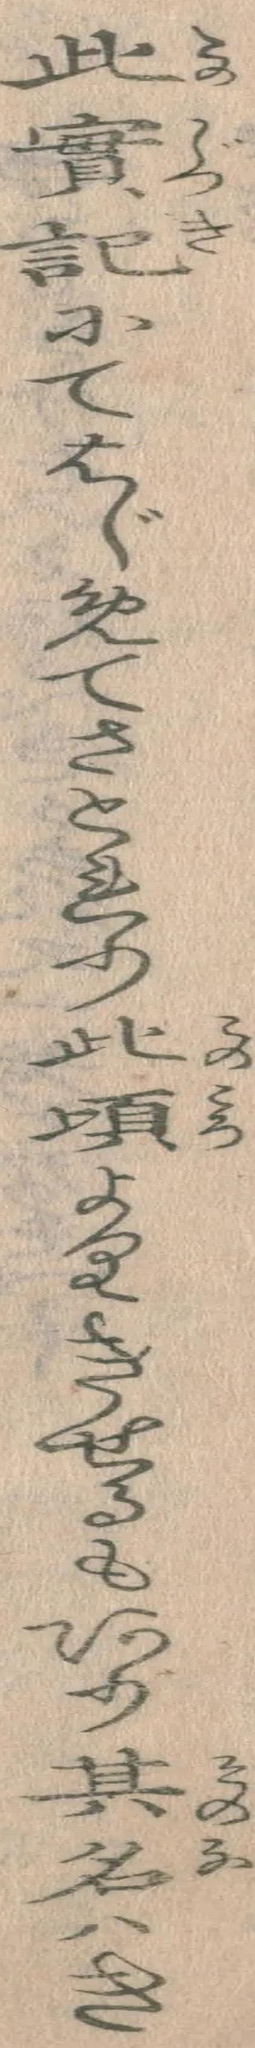此実記にてはじめてさとれり此頃よりきせるもあり其名はき
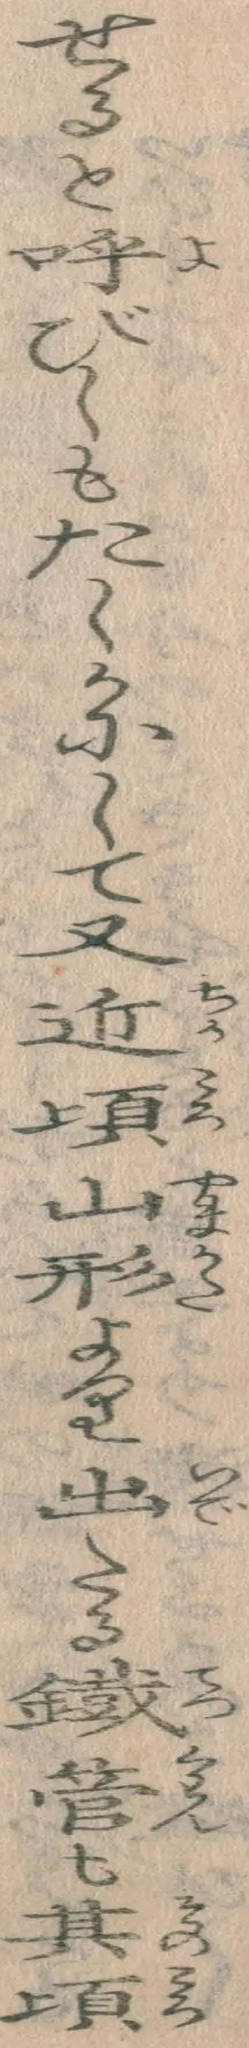せると呼びしもたしかにして又近頃山形より出たる鉄管も其頃
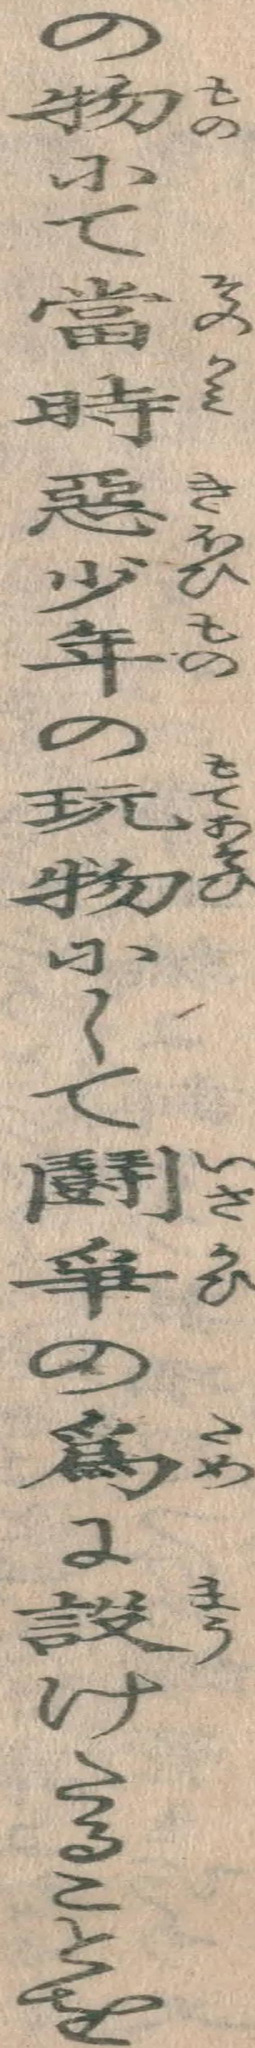の物にて当時悪少年の玩物にして闘争の為に設けたることを
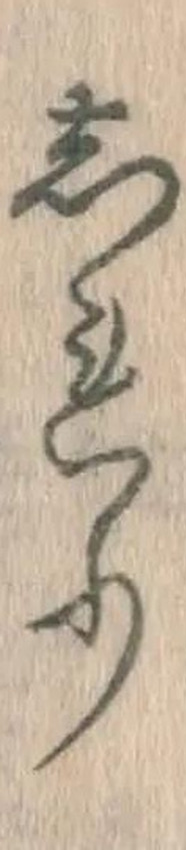しれり
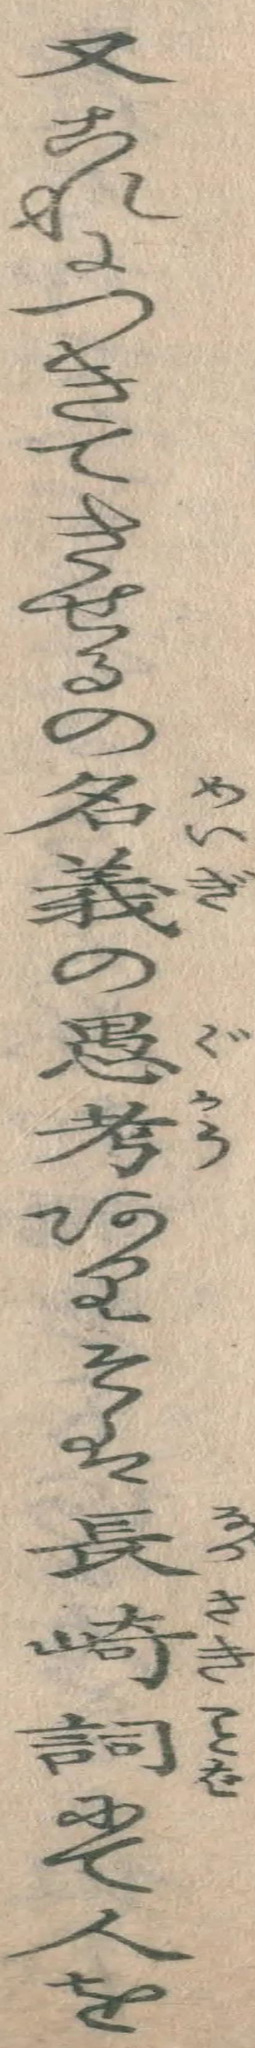又これにつきてきせるの名義の愚考ありそは長崎詞にて人を
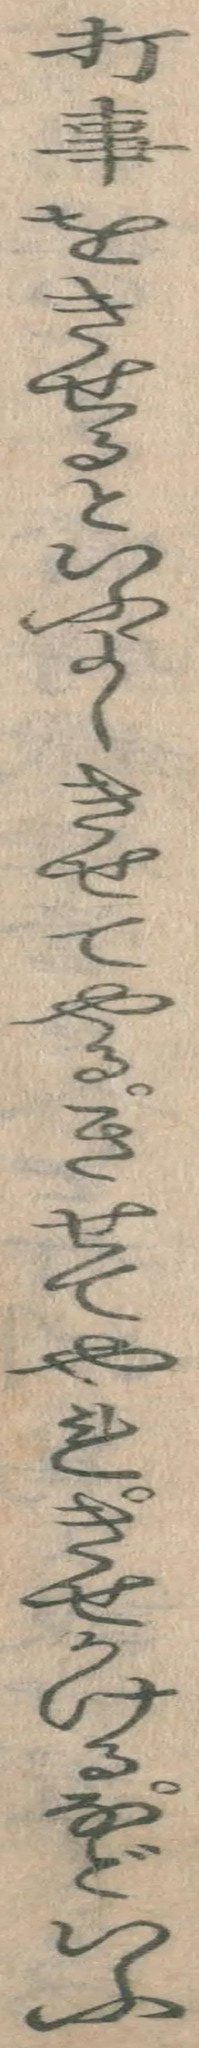打事をきせるといふよしきせてやる。きせてやれ。きせかける。などいふ

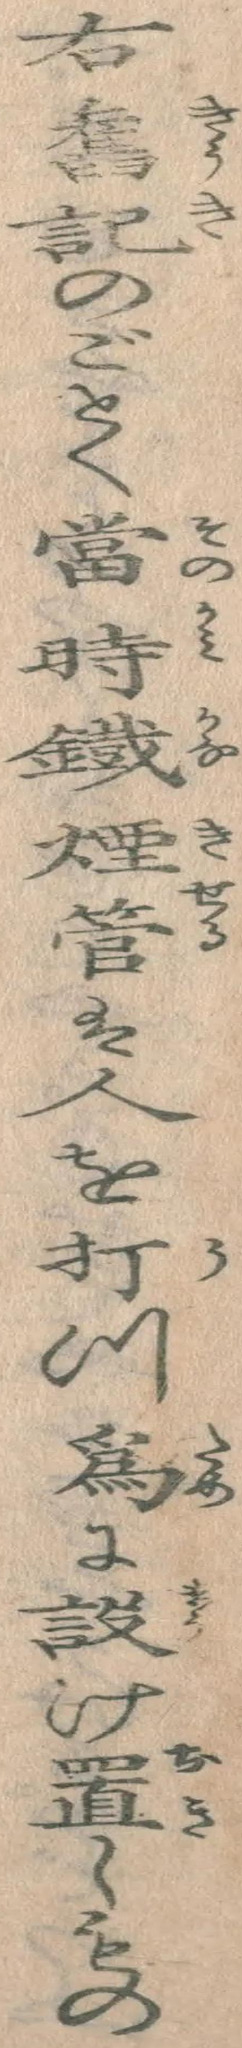右旧記のごとく当時鉄煙管は人を打つ為に設け置しもの
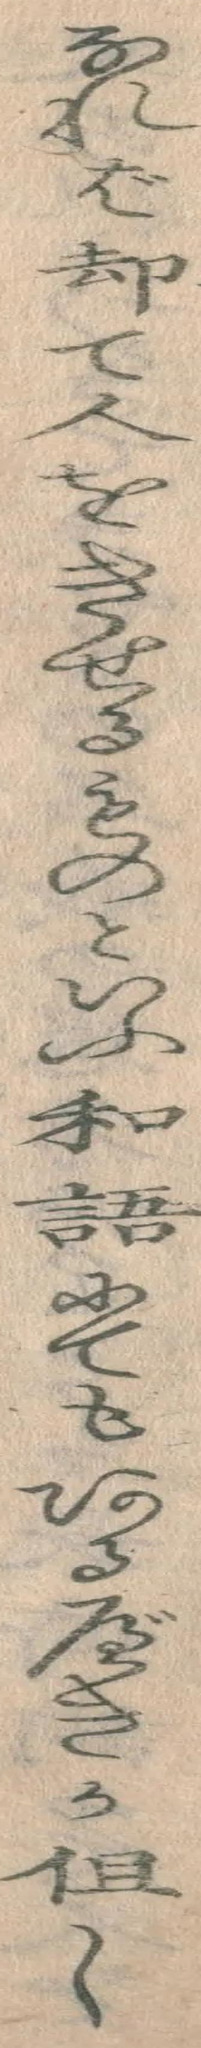なれば却て人をきせるものといふ和語にてもあるべきか但し
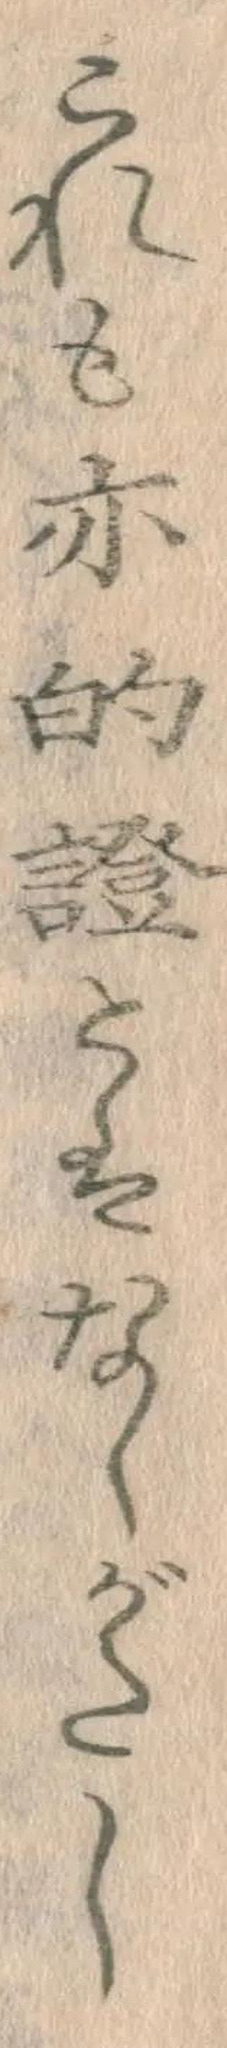これも亦的証とはなしがたし
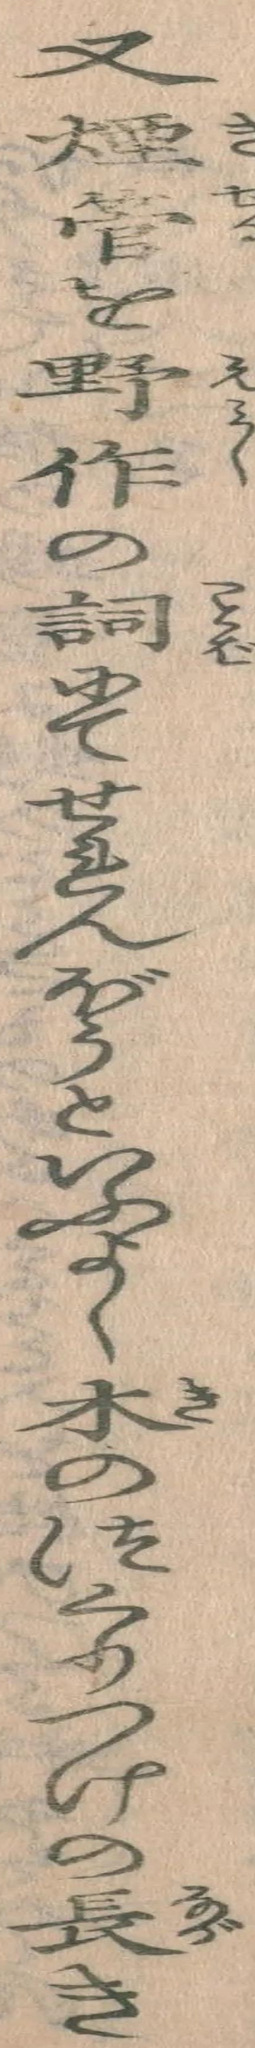又煙管を野作の詞にてせれんぼうといふよし木のつくりつけの長き
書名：目さまし草
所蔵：国立国会図書館 National Diet Library, JAPAN
